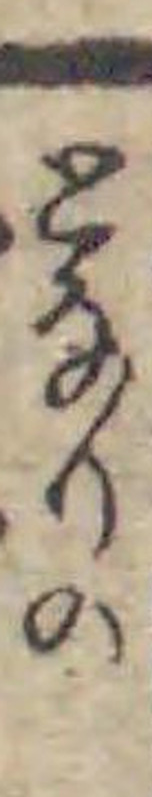となりの
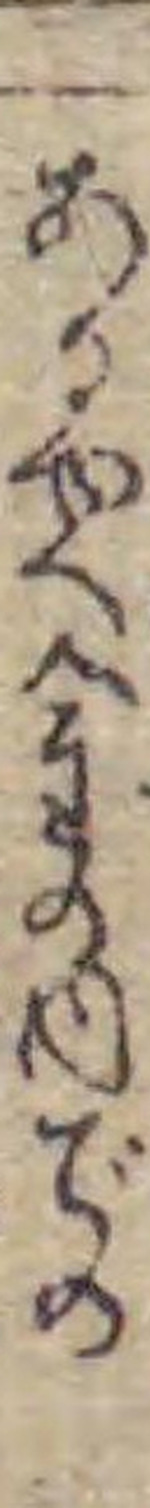あるゆへ金の内での
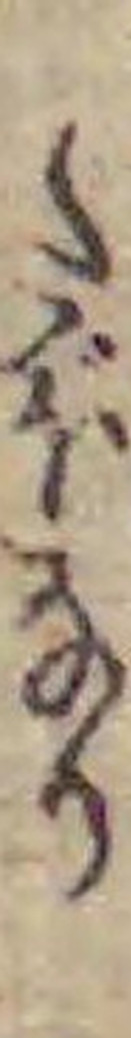たぼなり
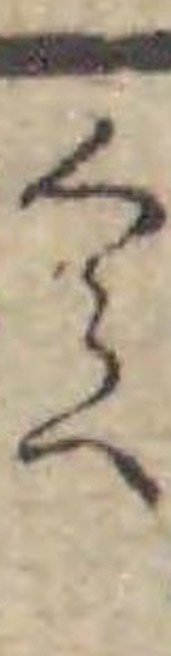くらへ
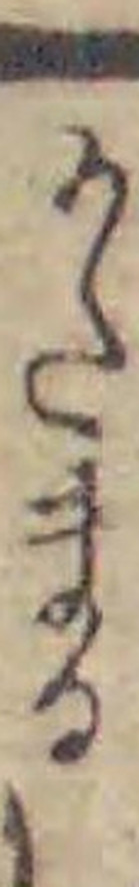かたまる

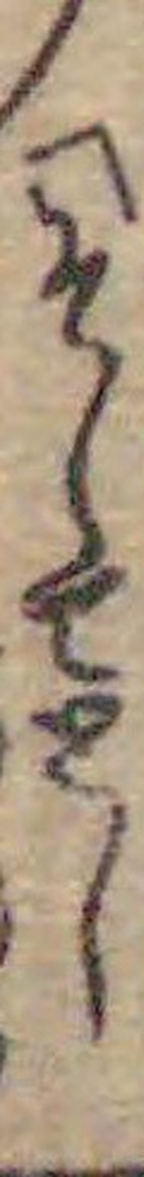〽そしてとし
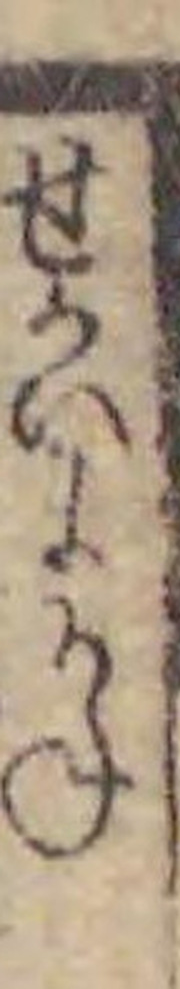せかいにかね
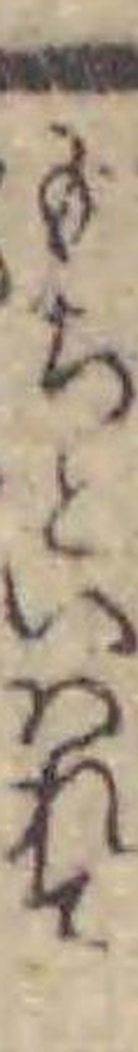もちといはれて
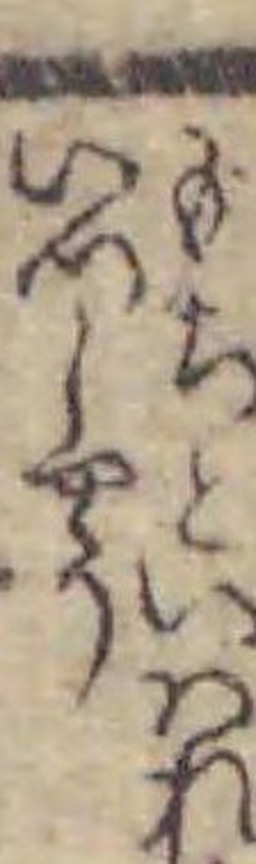いつしやう
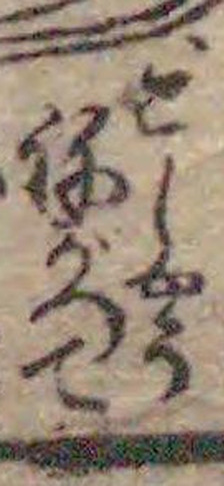ねがつて
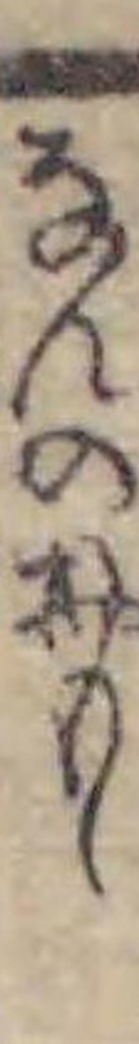なんのおもし
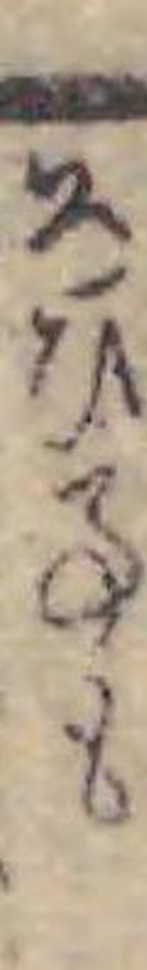ろひ事も
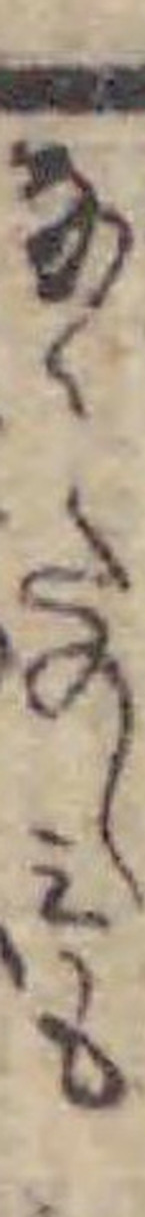なくたのしみも
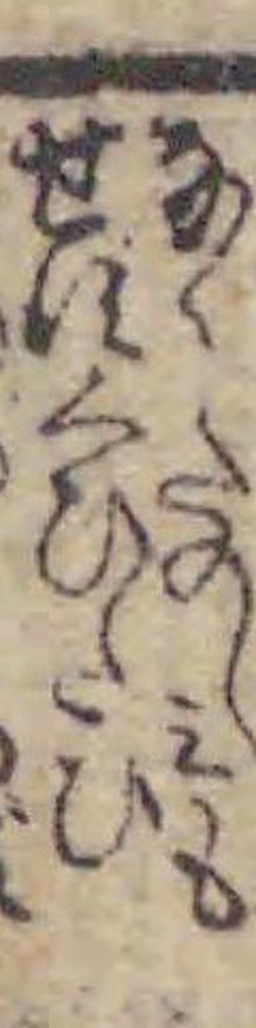せにくひたひ
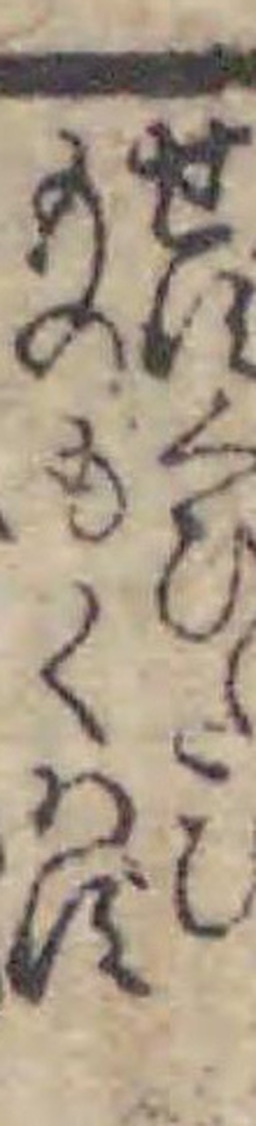ものもくはず
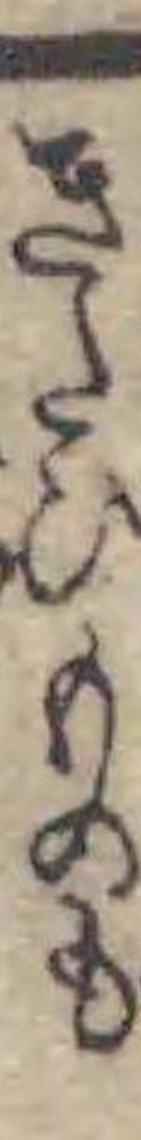きたひものも
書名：新鋳小判 : 3巻
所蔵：国立国会図書館 National Diet Library, JAPAN
